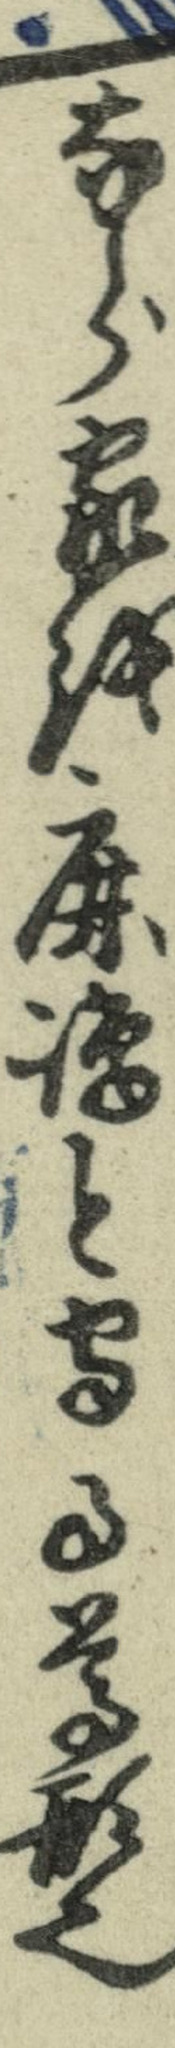なら家を鹿嶋と守る尊形也
